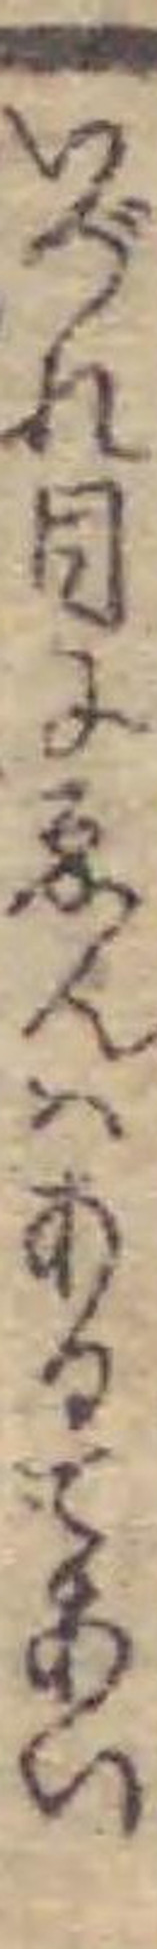いづれ目にゑんはあるてあい
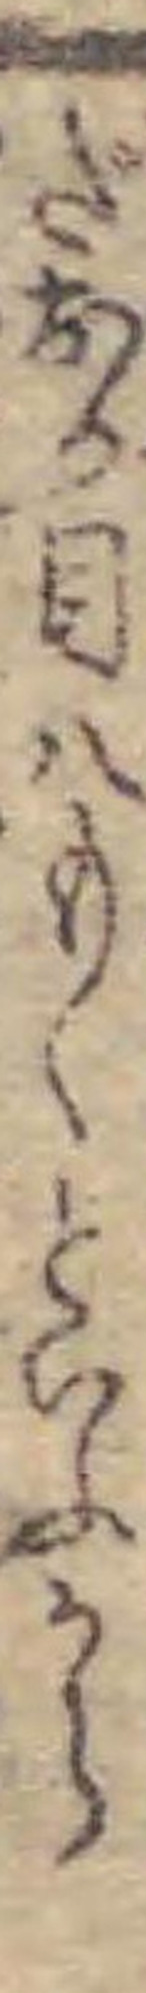だおか目八もくといふから
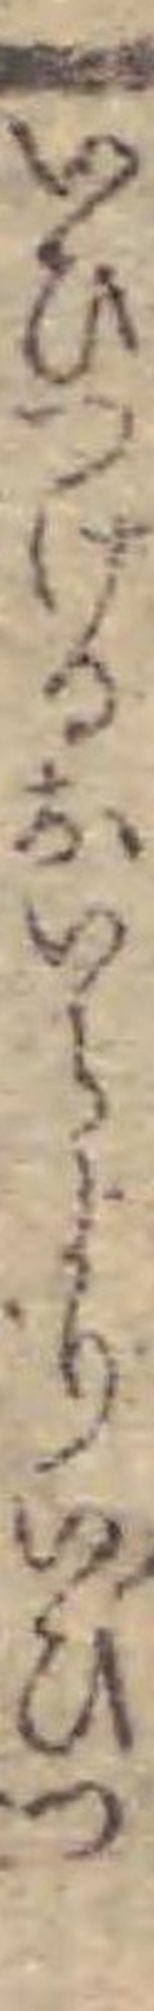いひつけるおいらよりいひつ
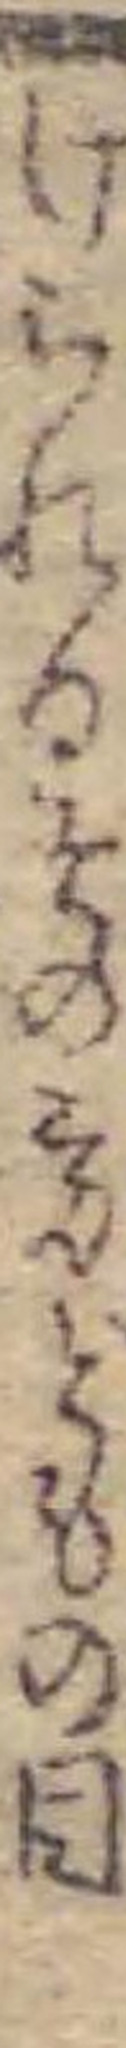けられるその方どもの目
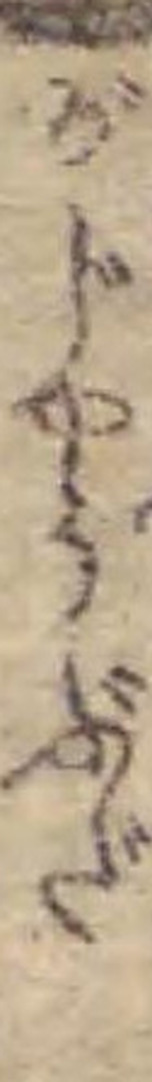がじやうぶだ
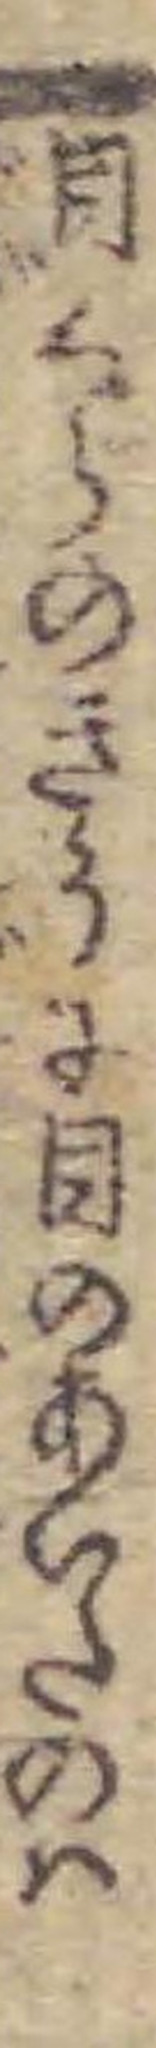目くらのきうに目のあいたのは
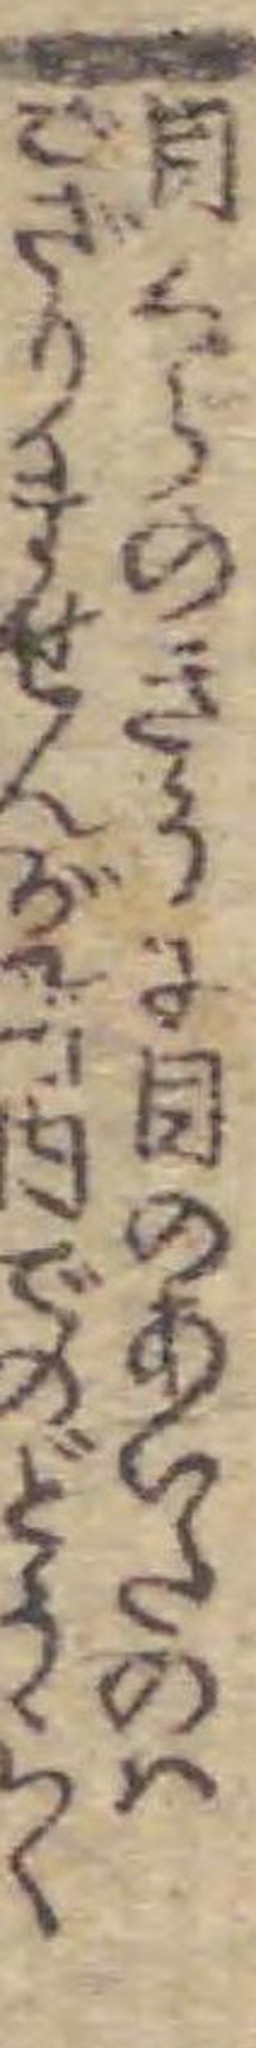ござりませんが町内でのどうらく
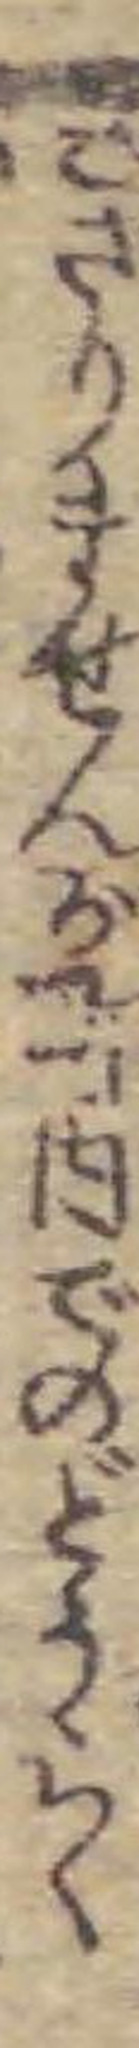ござりませんが町内でのどうらく
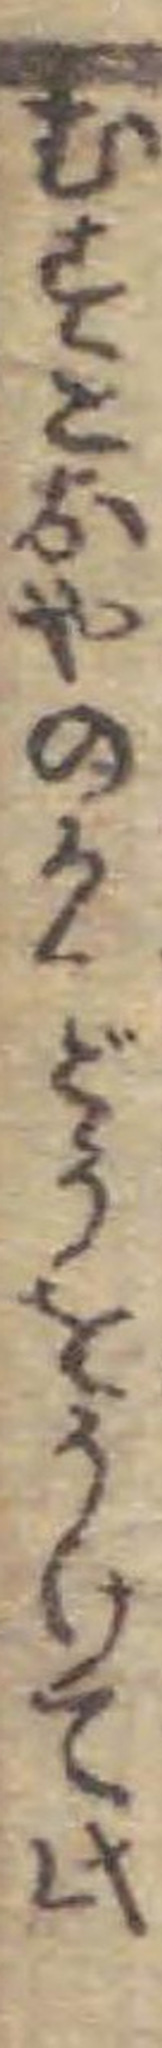むすこおやのかんどうをうけて此
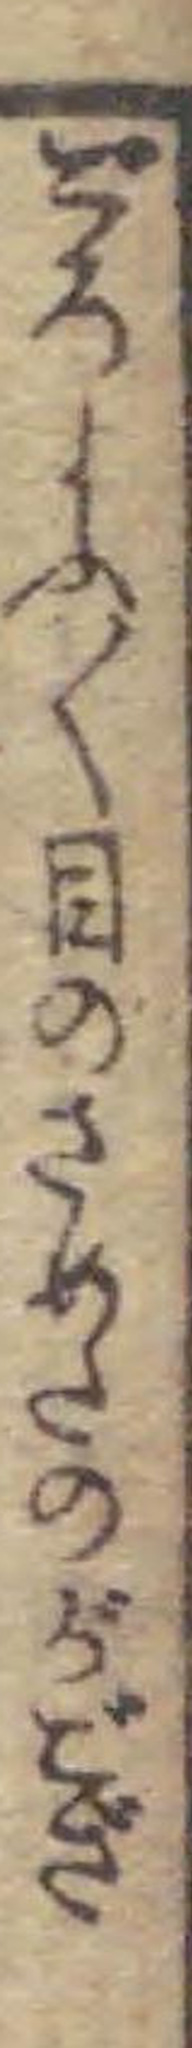ごろよふ〳〵目のさめたのがござ
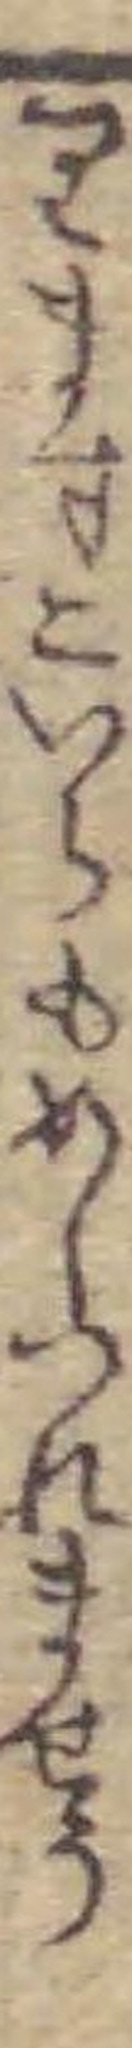りますこいらもめしつれませう
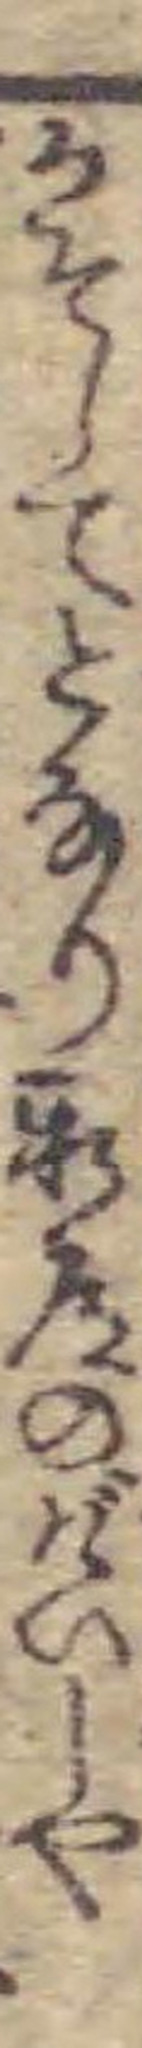かそしてとなり新道のげいしや
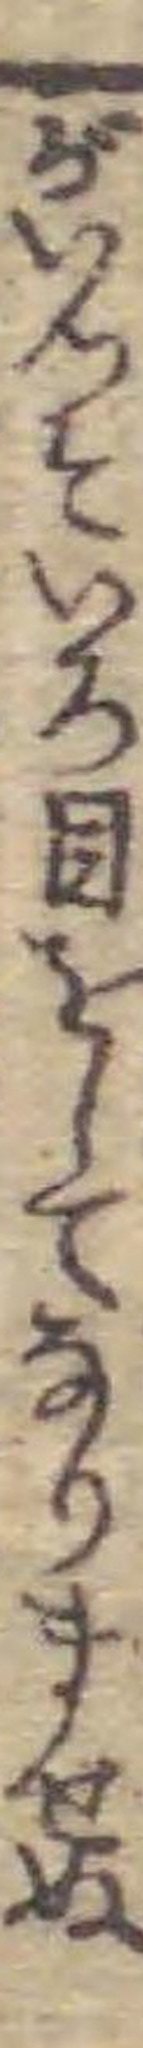がいつそいろ目をしてなりませぬ
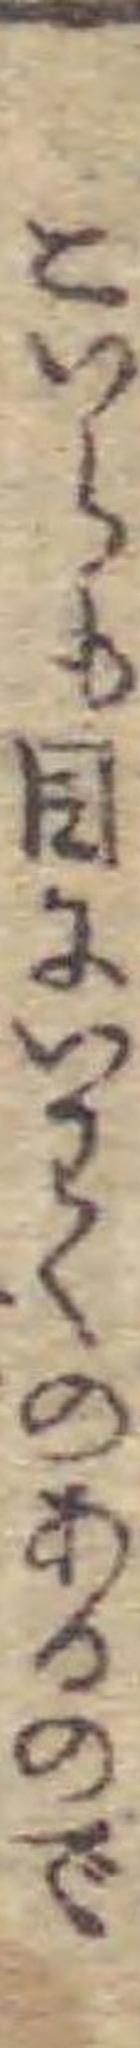こいらも目にいわくのあるので
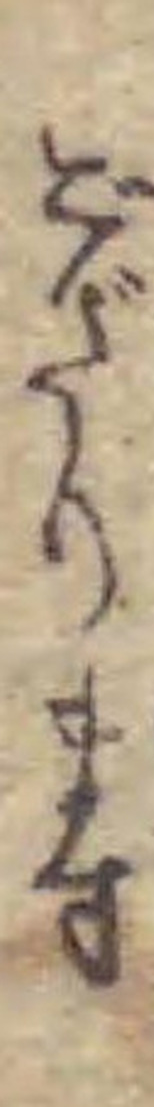ござります
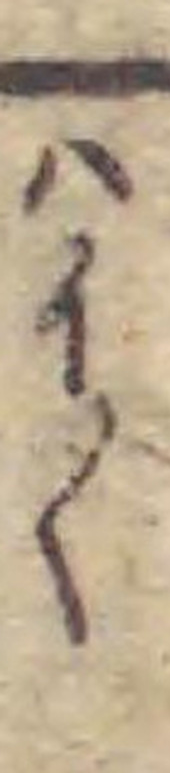ハイ〳〵
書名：悪七変目景清 : 2巻
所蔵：国立国会図書館 National Diet Library, JAPAN
